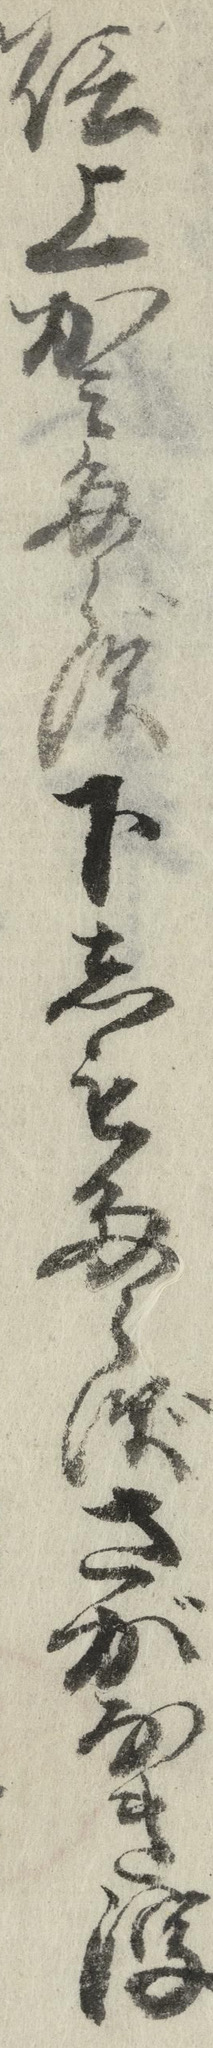信上かみたらず下しもたらずさがなき浮
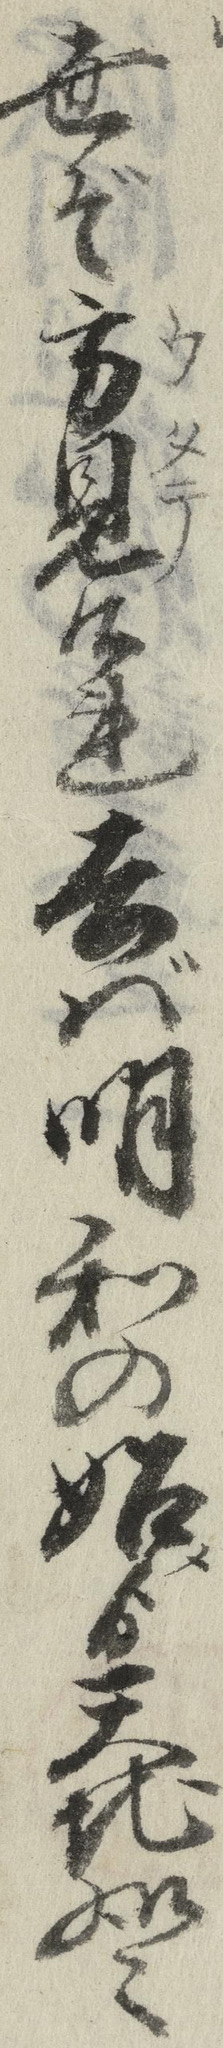世ぞ方見けれ去ば明和の始メゟ天地様々
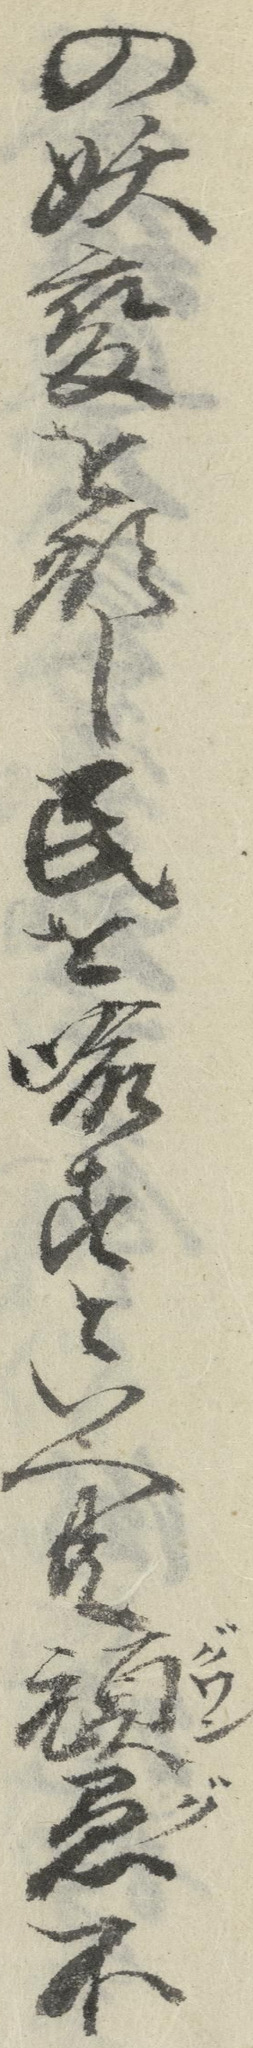の妖変を顕し民を喩すといへ共頑愚不
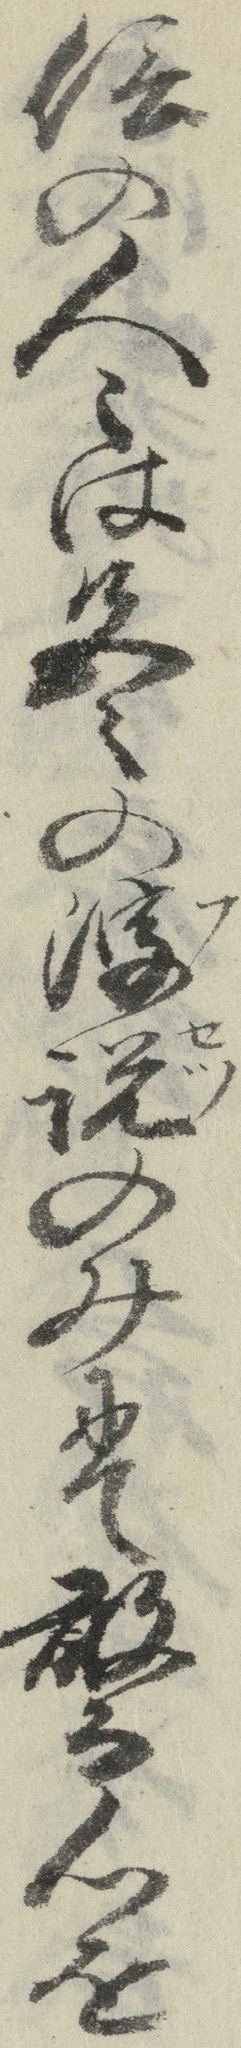信の人々は色々の浮説のみにて敢而心を
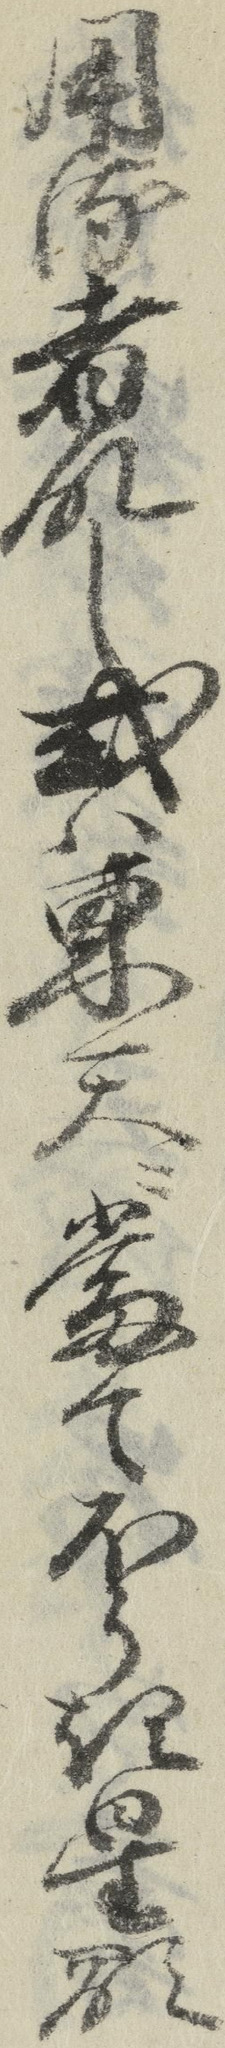用る者糺し或は東天ニ当てほうき星顕
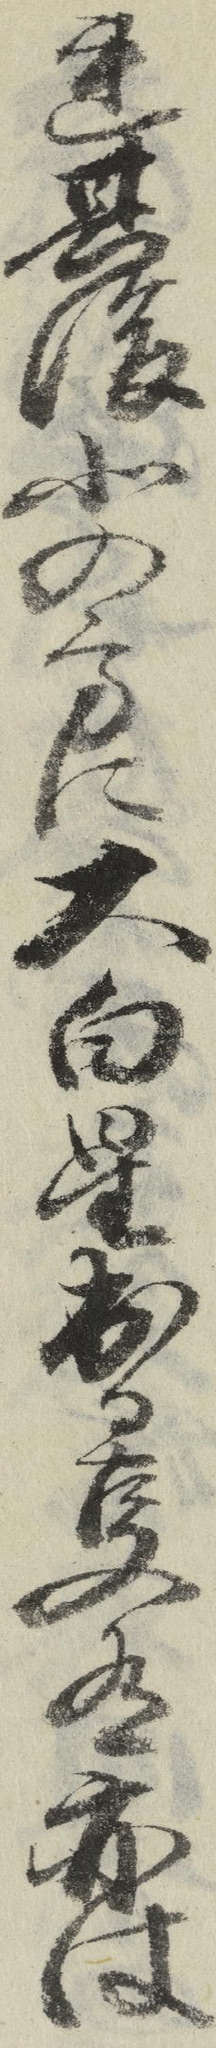れ其後北の方に大白星出る事有亦は
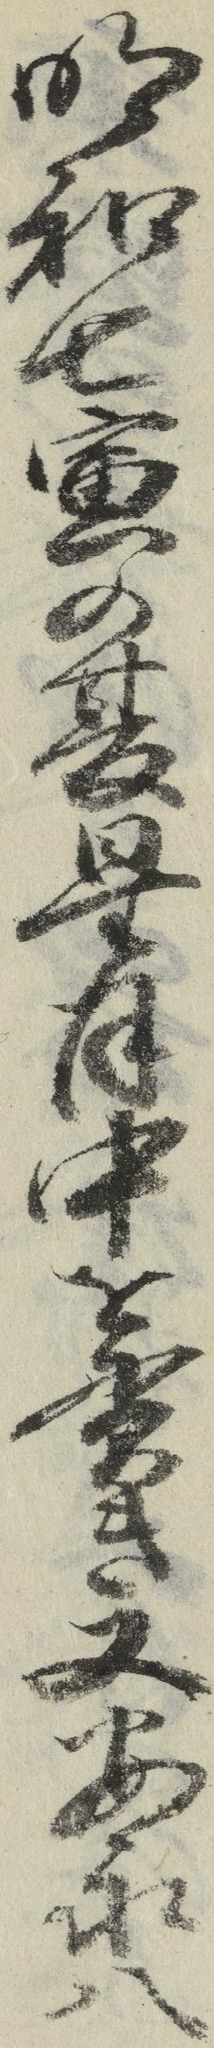明和七寅の夏星月中を貫き又安永八
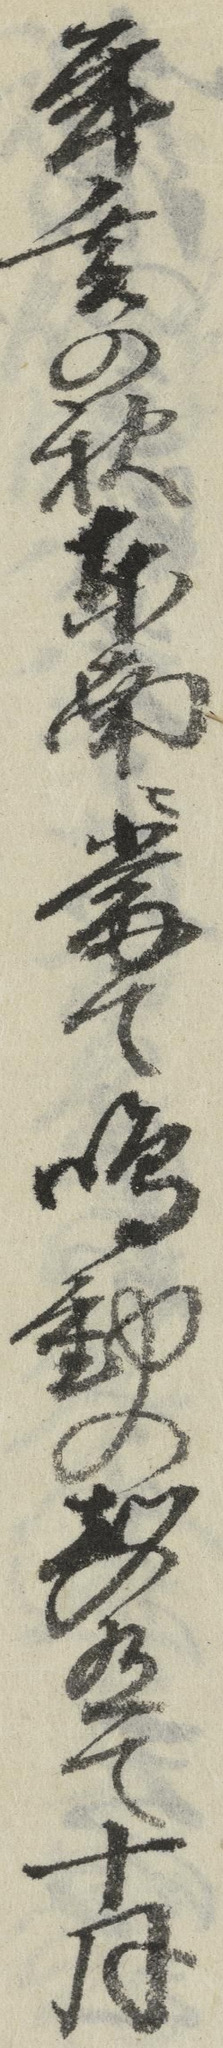年亥の秋東南ニ当て鳴動の声有之て十月
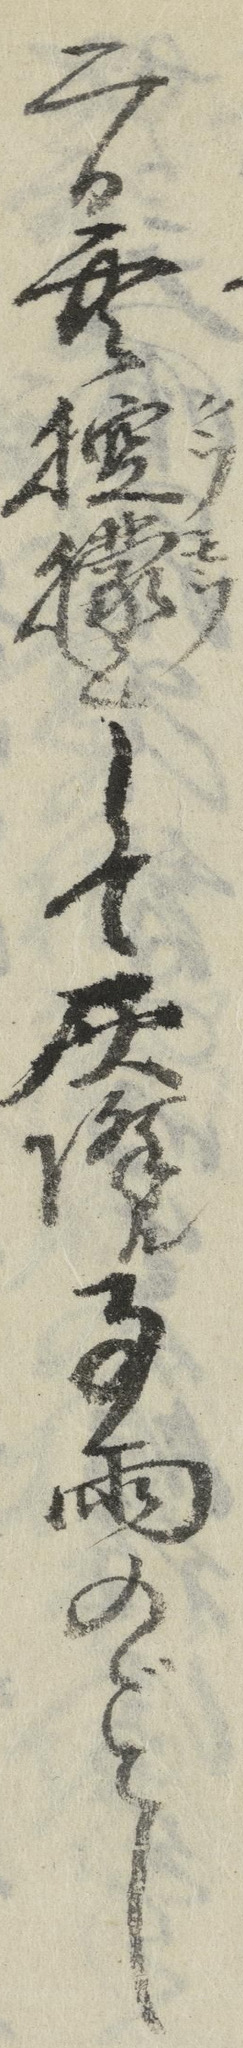二日空腔朦として灰降ル事雨のごとし
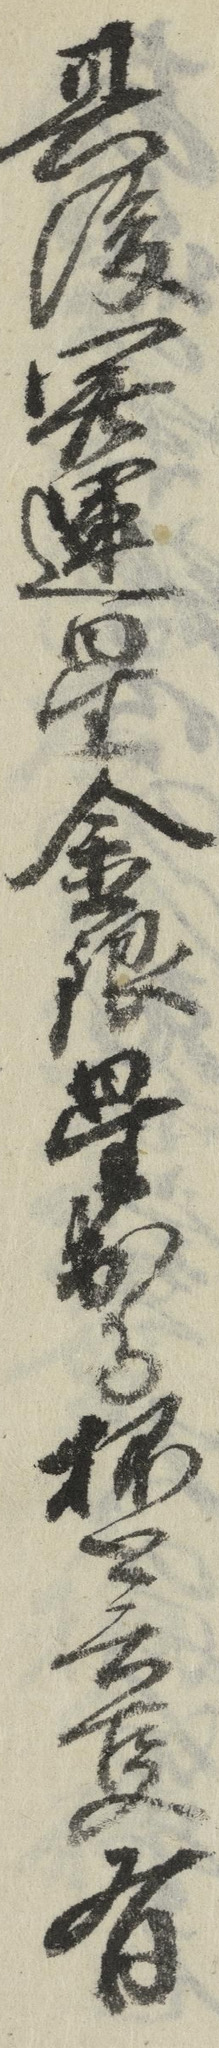其後開運星金銀星出る抔と云事有

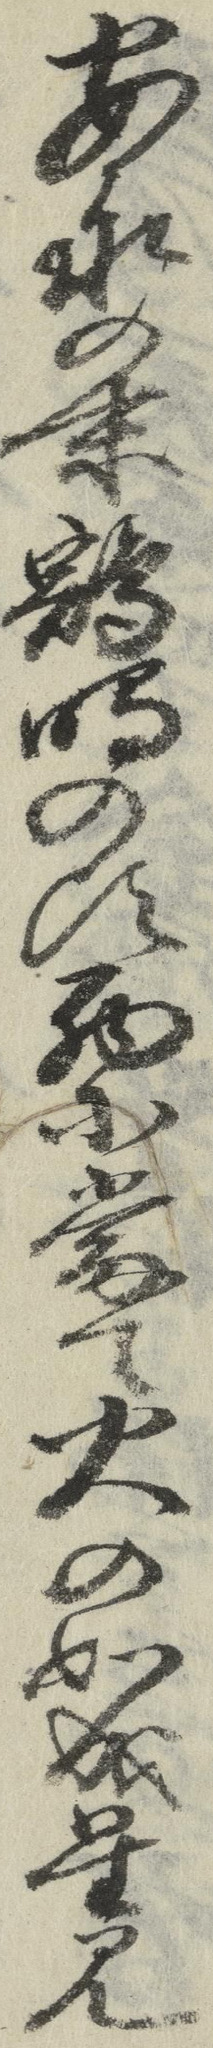安永之末鶏鳴の頃西に当て火の如成星見
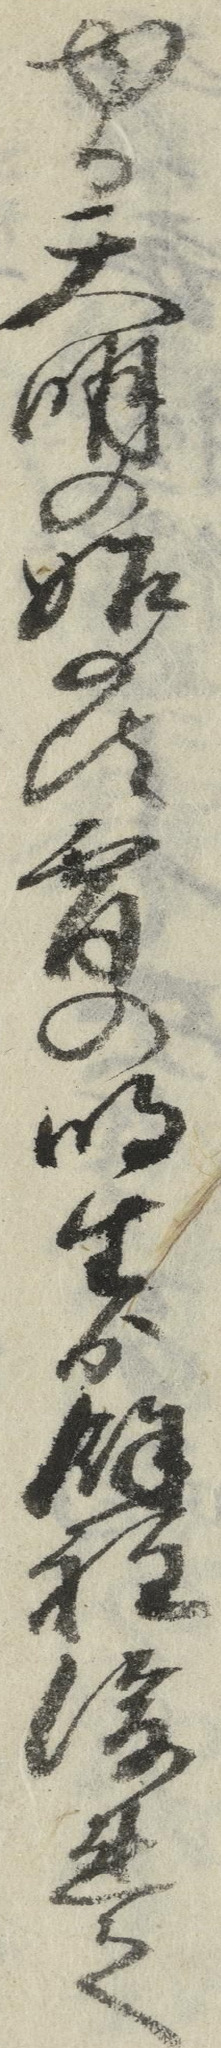ゆる天明の始の頃宵の明生ゟよ程後れて
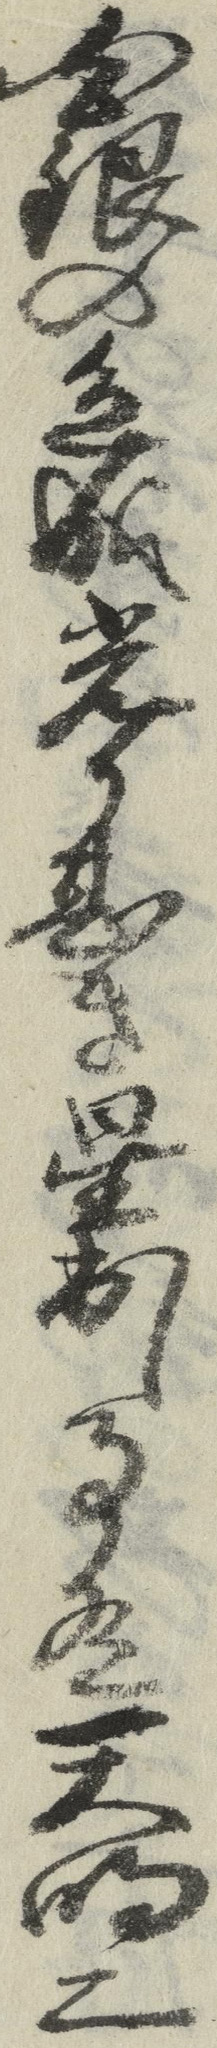金銀の色成光り甚き星出し事有之天明ニ
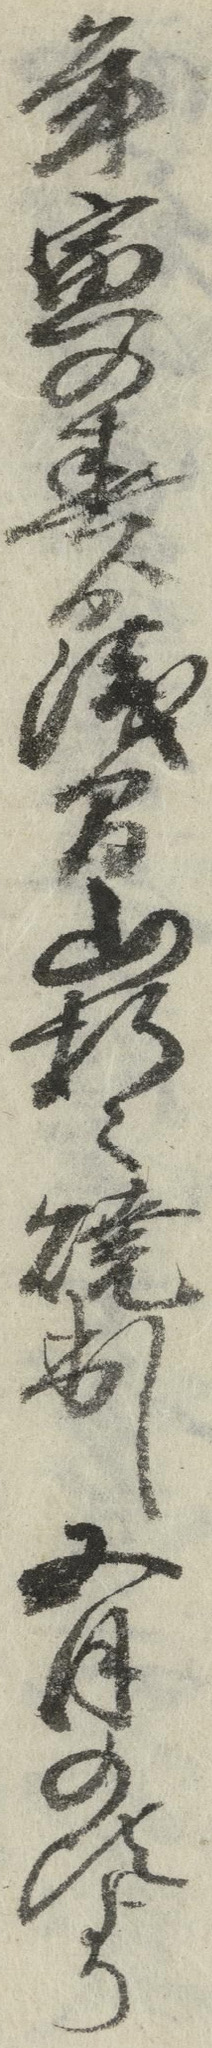年寅の春ゟ浅間山折々焼出し五月の頃より
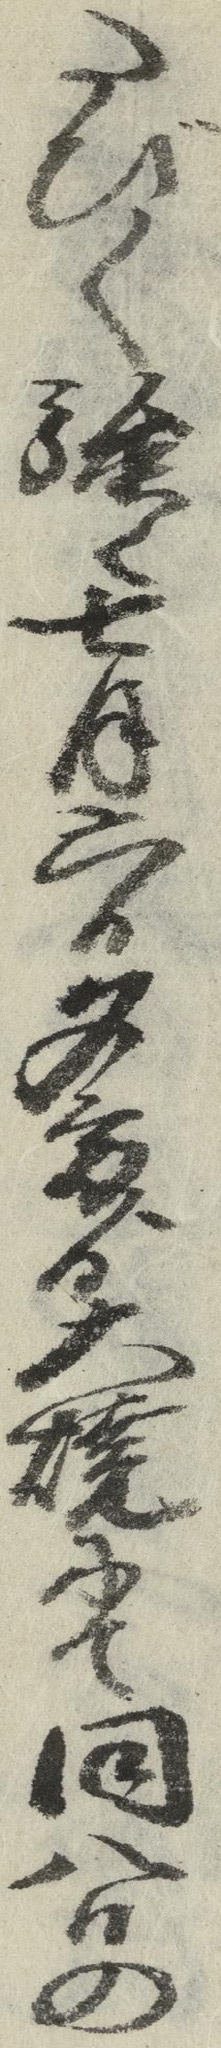たび〳〵強く七月日夕方ゟ大焼にて同八日の
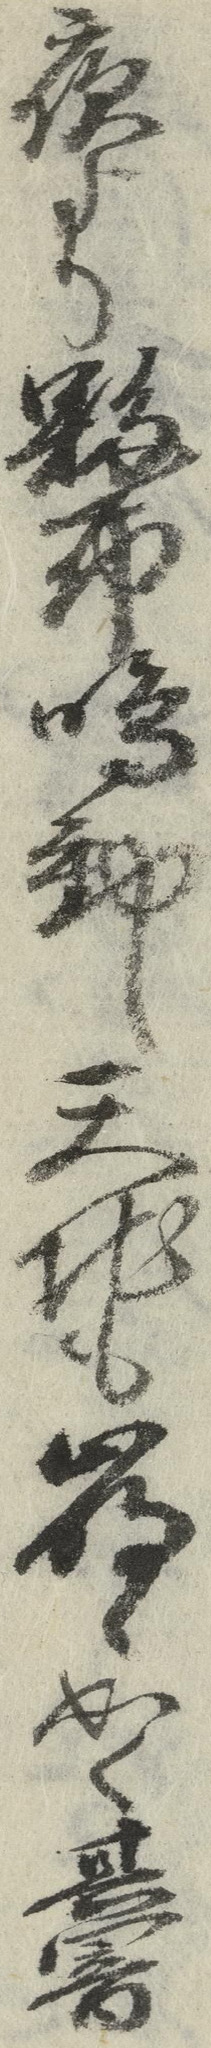夜より夥布鳴動し天地も崩る如く其響
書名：浅間大焼騒動記　上
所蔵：東京大学地震研究所図書室 Earthquake Research Institute Library, The University of Tokyo, JAPAN
